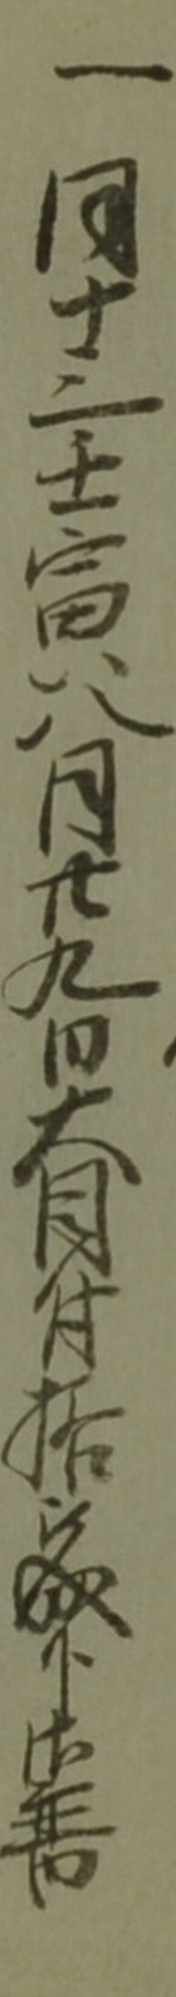一同十三壬寅八月廿九日大目付格被成下御普
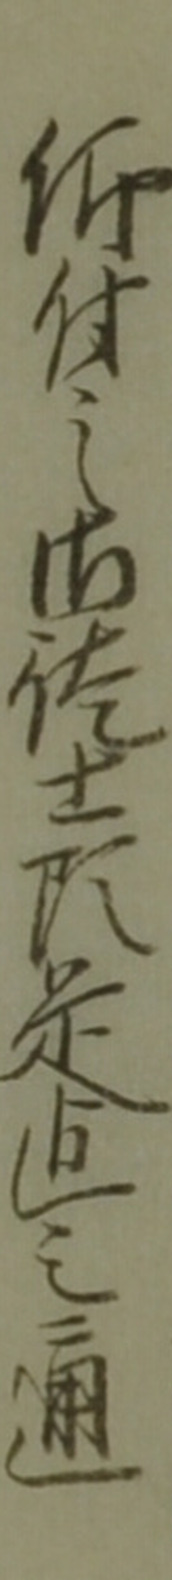仰付之御徒士頭是迄之通
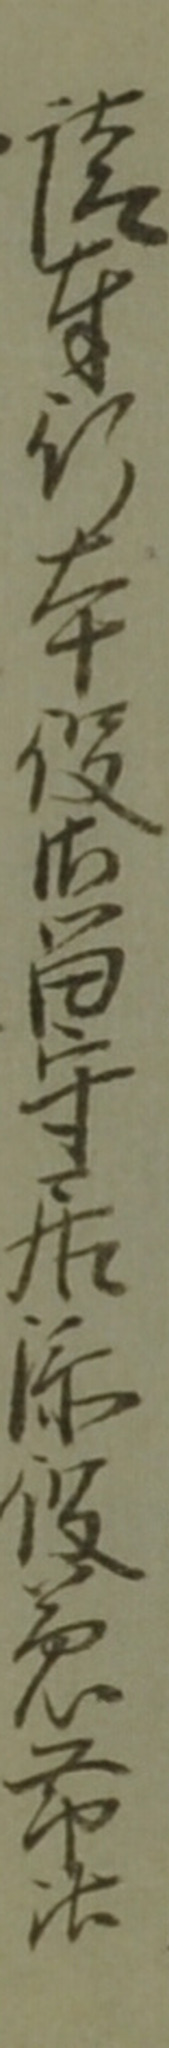請奉行本役御留守居添役兼帯被
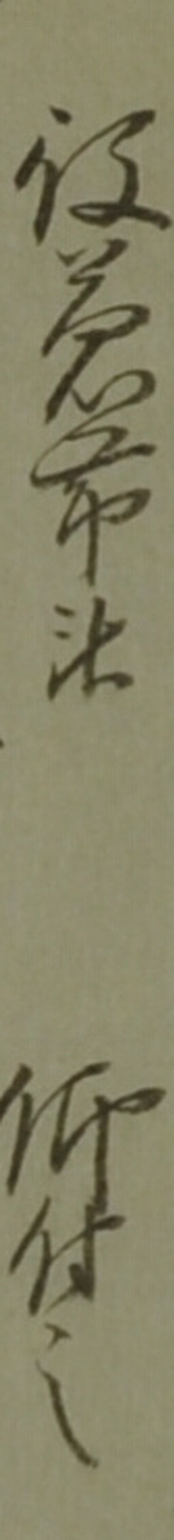役兼帯被仰付之

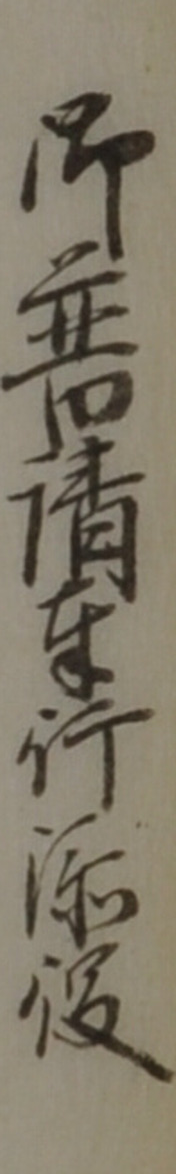御普請奉行添役
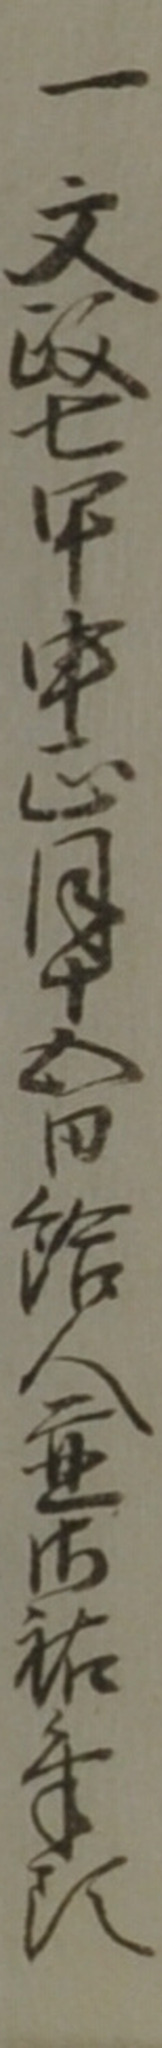一文政七甲申正月十五日給人並御祐筆頭
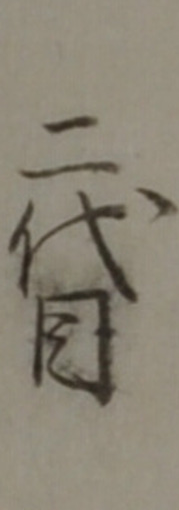二代目
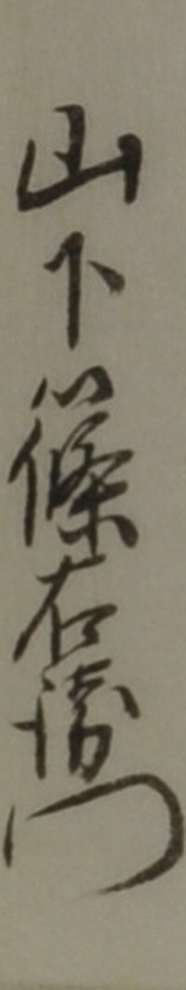山下篠右衛門
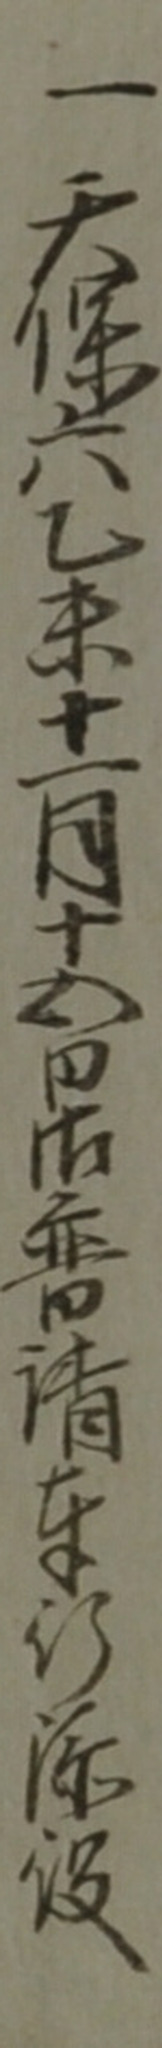一天保六乙未十一月十五日御普請奉行添役
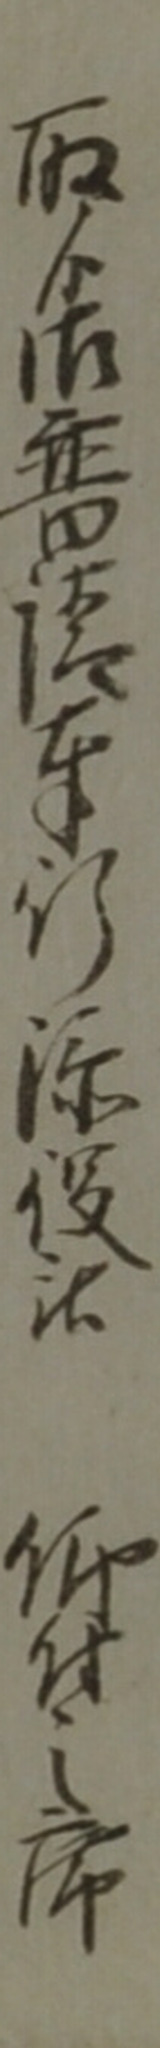取ゟ普請奉行添役被仰付之席
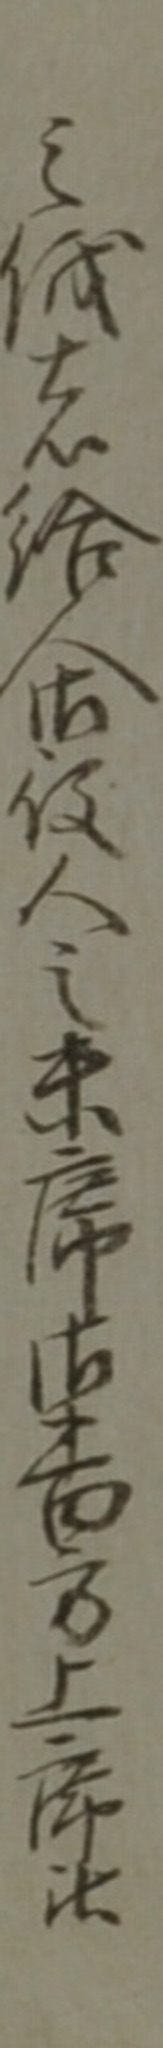之儀者給人御役人之末席御番方上席被
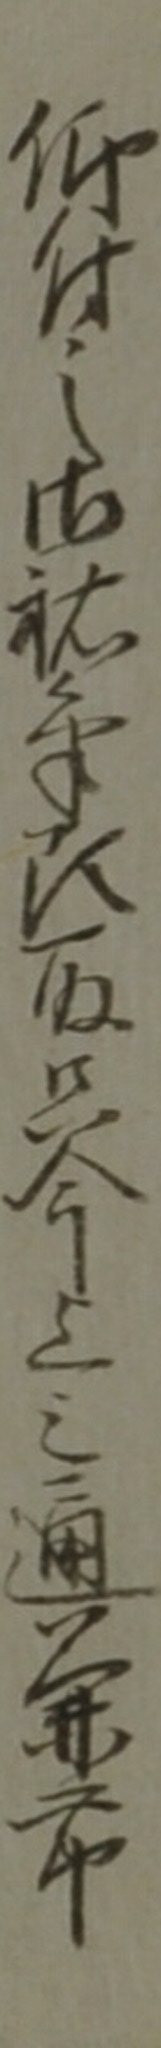仰付之御祐筆頭取只今迄之通兼帯
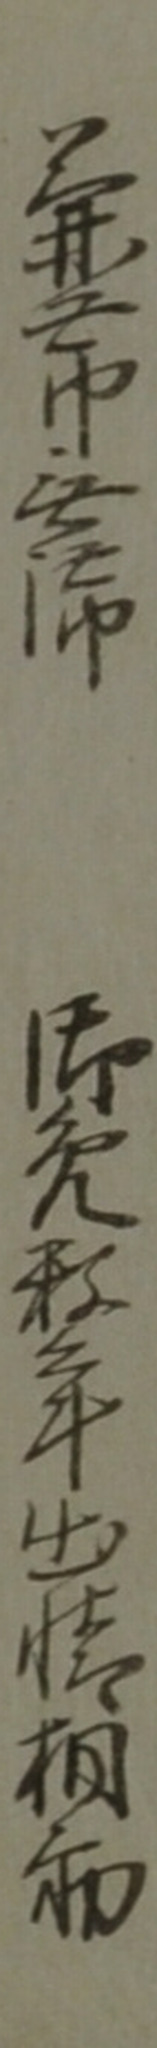兼帯無滞御免数年出精相勤
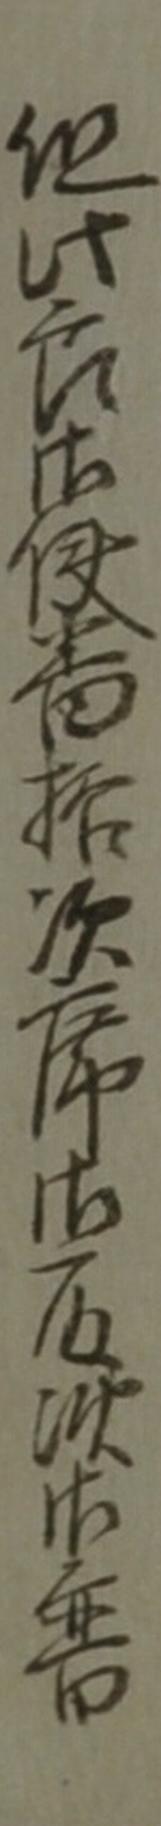但此節御使番格次席御取次御普
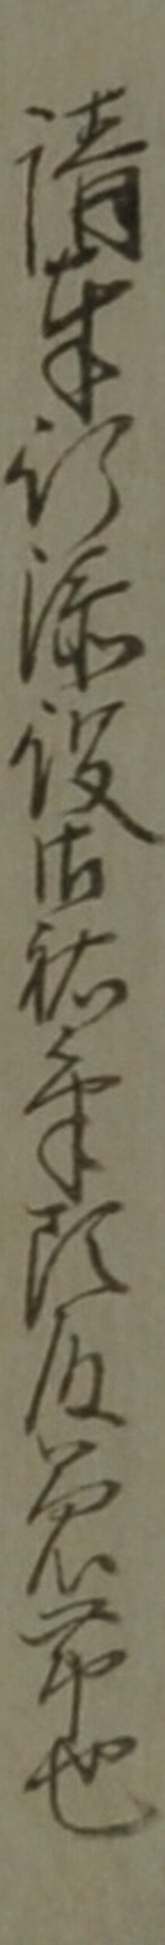請奉行添役御祐筆頭取兼帯也

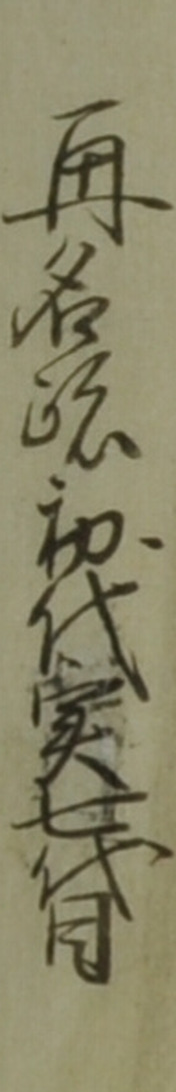再名跡初代実七代目
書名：諸御役代々録（六）
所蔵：伊那市立高遠町図書館・合同会社AMANE
